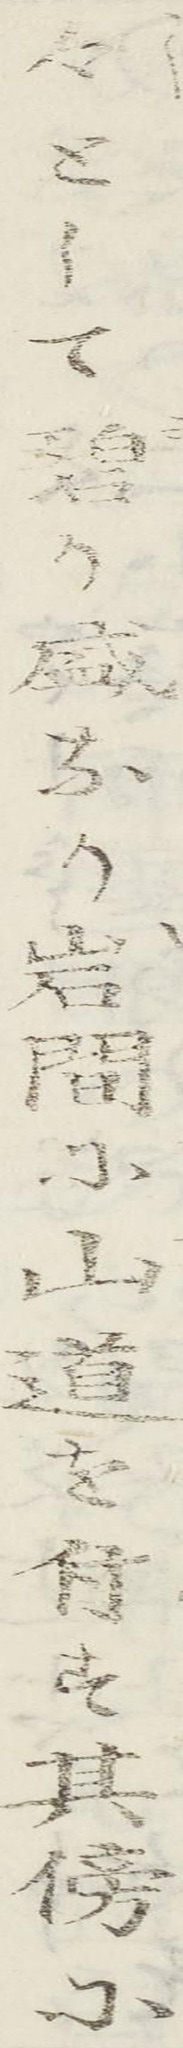々として碧り盛なり岩間に山道を付す其傍に
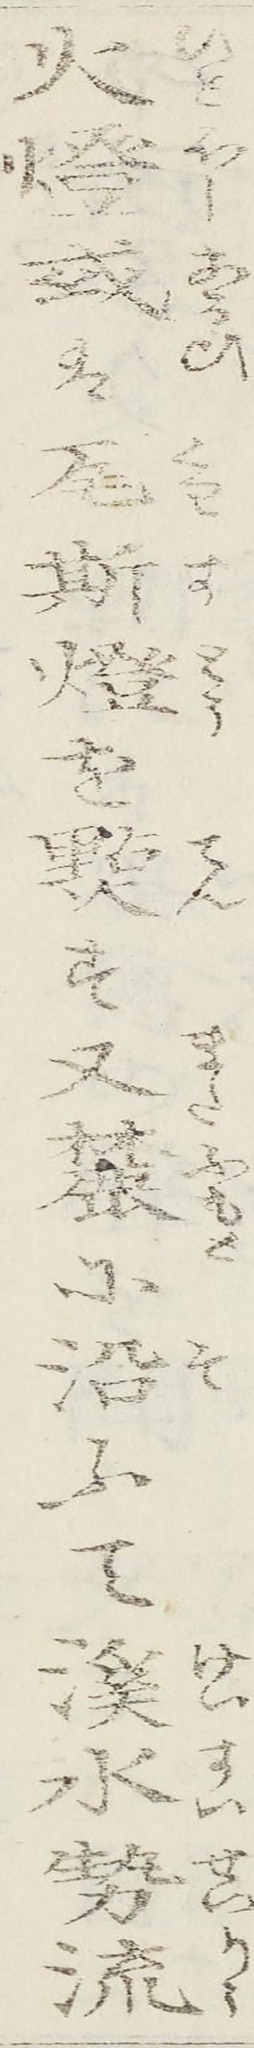火灯或は瓦斯灯を点す又麓に沿ふて渓水勢流
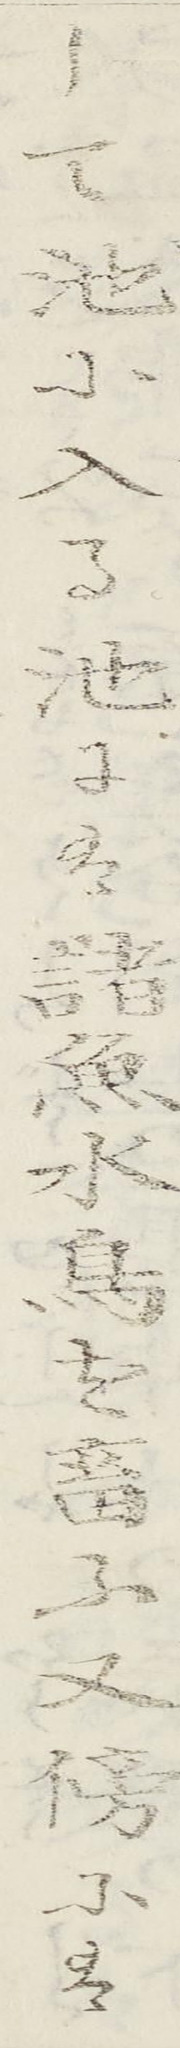して池に入る池には諸魚水鳥を畜ふ又傍には
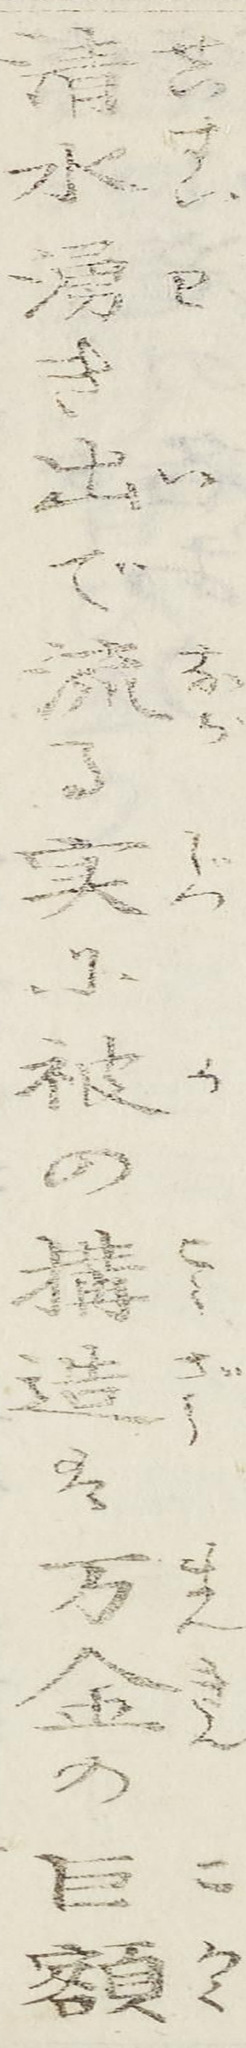清水湧き出で流る実に被の構造は万金の巨額
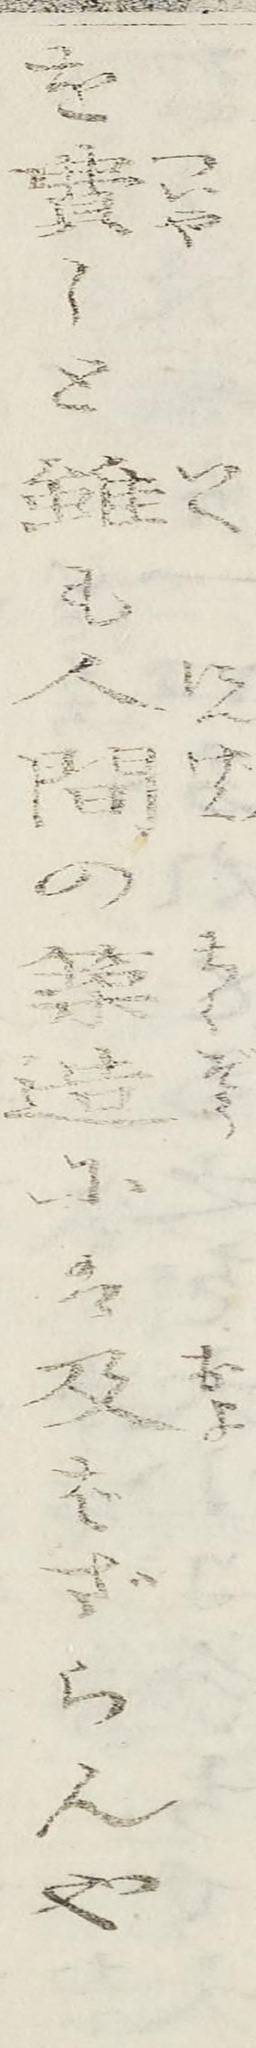を費しと雖も人間の築造には及ばざらんや
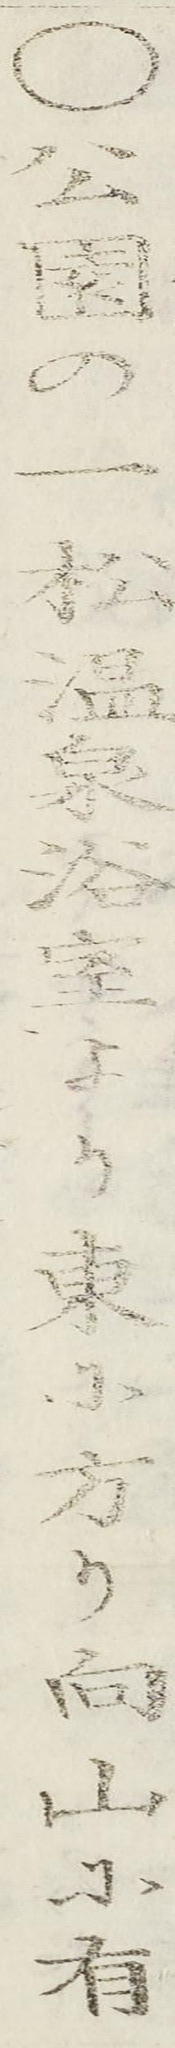○公園の一松温泉浴室より東に方り向山に有
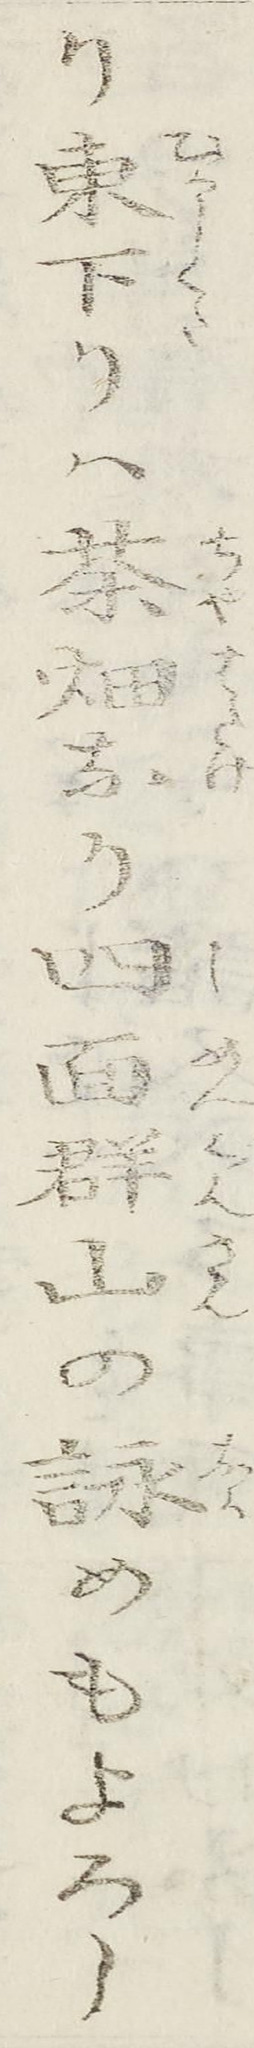り東下りは茶畑なり四面群山の詠めもよろし
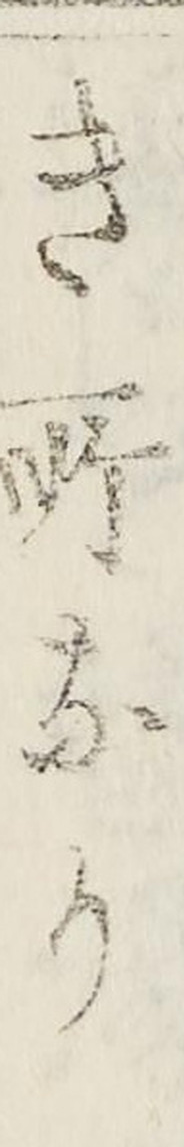き所なり
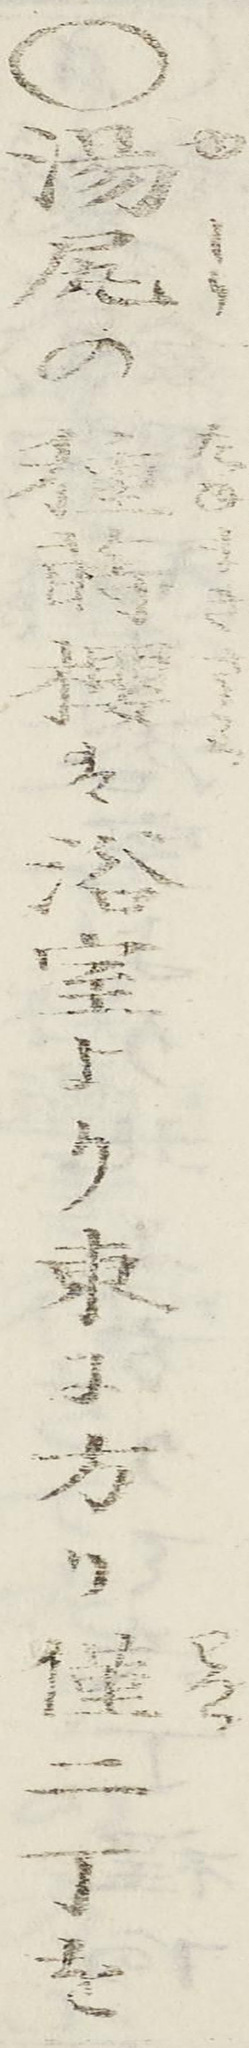○湯尻の種蒔桜は浴室より東に方り僅二丁を
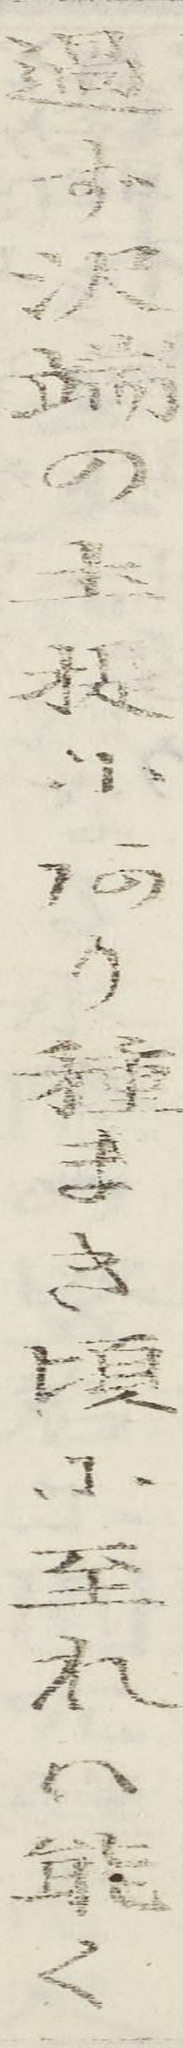過ず沢端の土提にあり種まき頃に至れは能く
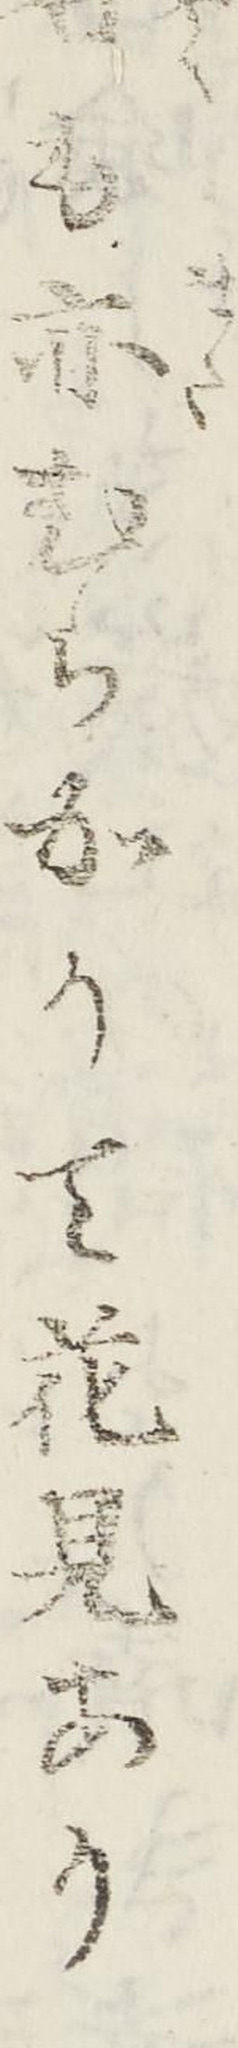客も亦むらかりて花見あり
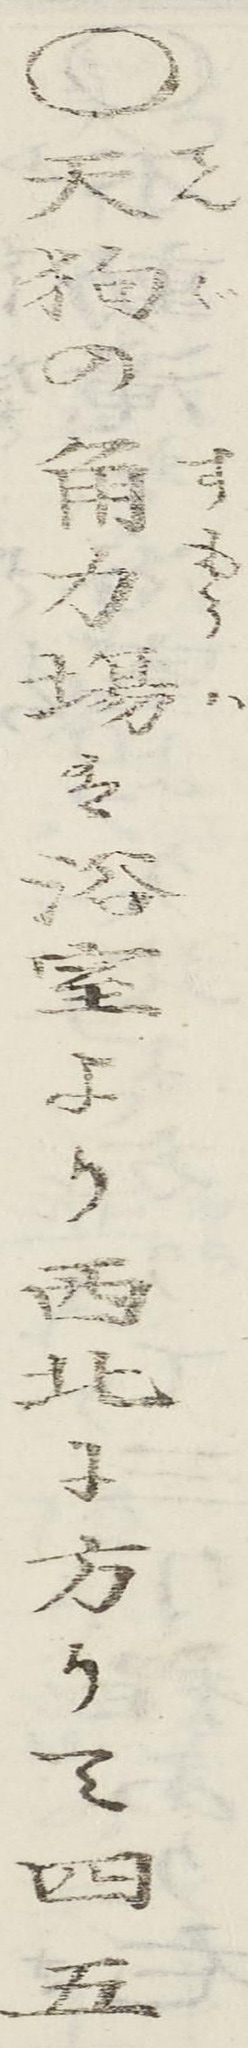○天狗角力場は浴室より西北に方りて四五
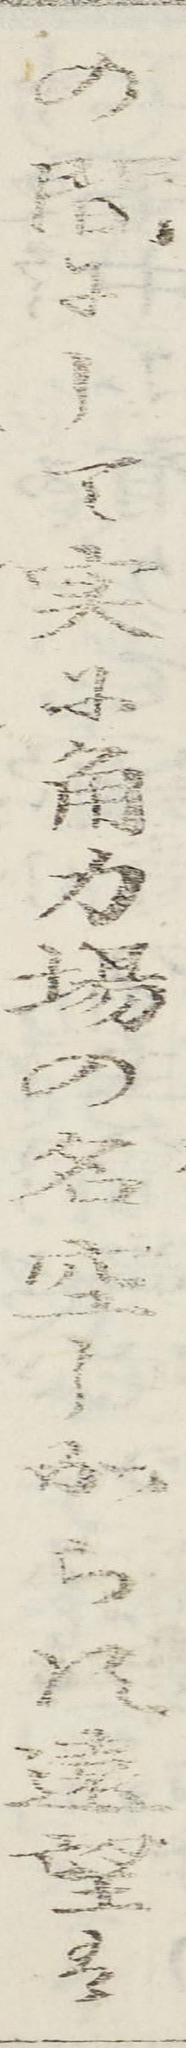の間にして実に角力場の名空しからす遠望は

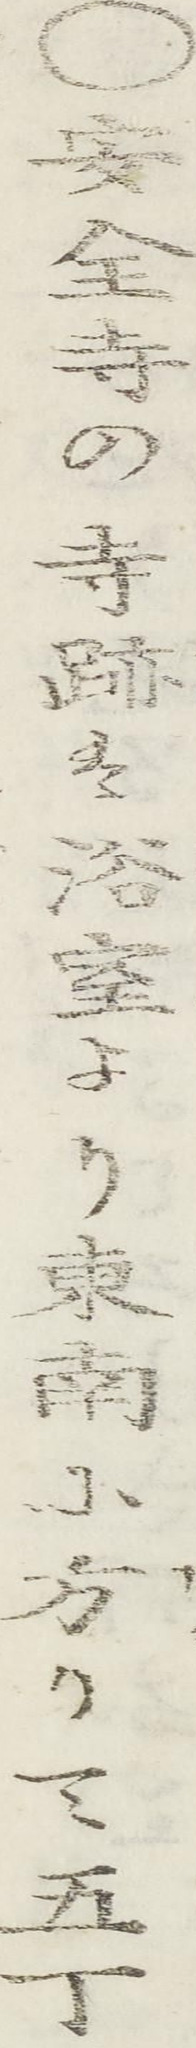○安全寺の寺跡は浴室より東南に方りて五丁
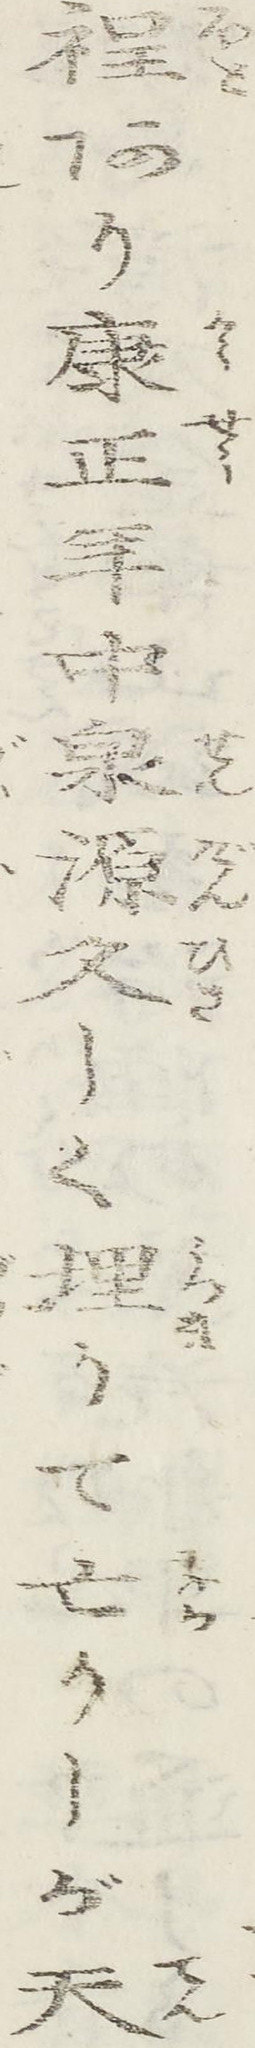程あり康正年中泉源久しく埋りて亡りしが天
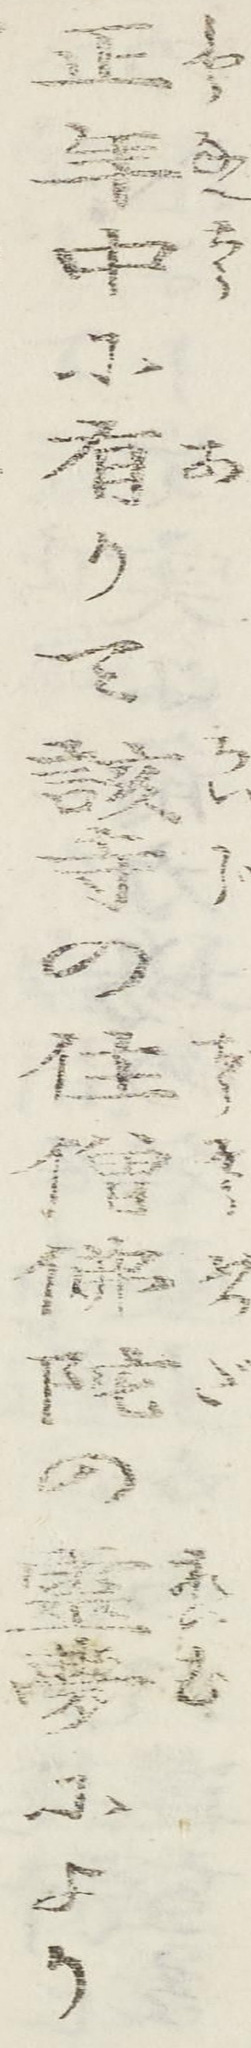正年中に有りて該寺の住僧仏陀の霊夢により
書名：鎌先温泉由來記
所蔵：東京大学地震研究所図書室 Earthquake Research Institute Library, The University of Tokyo, JAPAN
